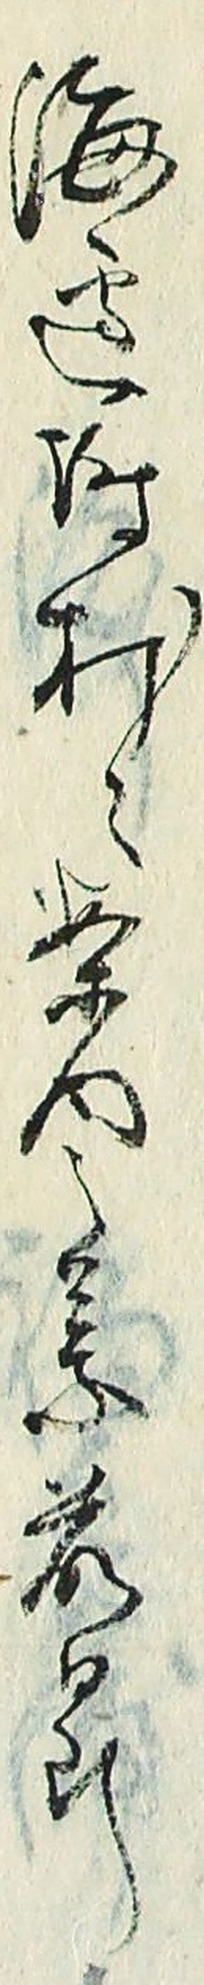海辺附村々案内之義前同断
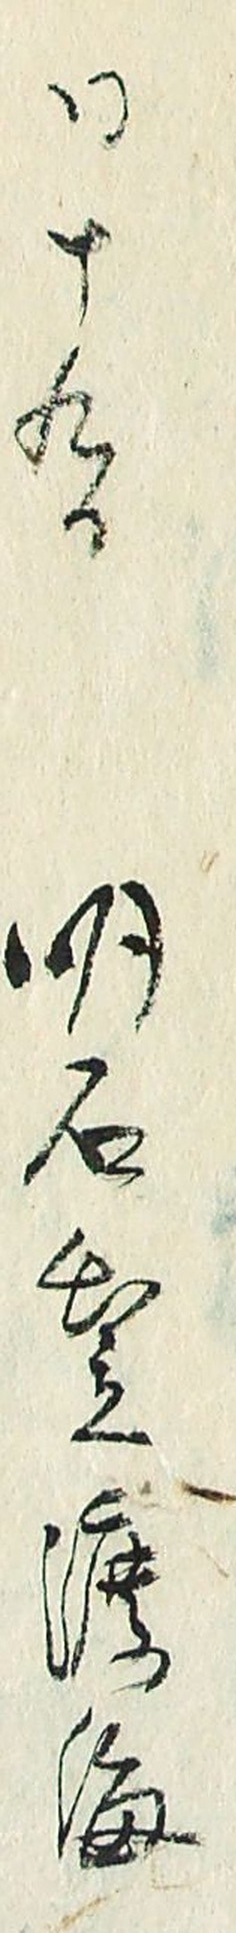同十九日明石出立渡海

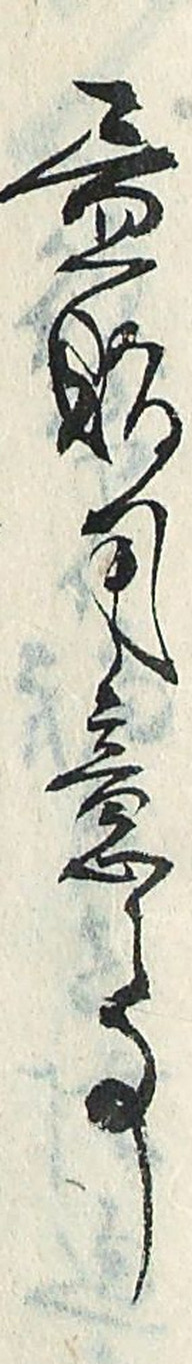昼賄用意之事
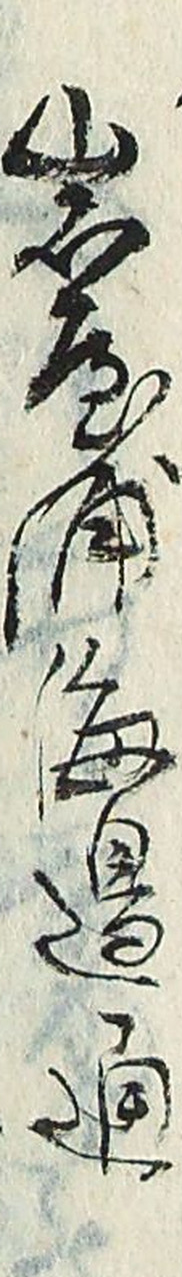岩屋浦海辺通
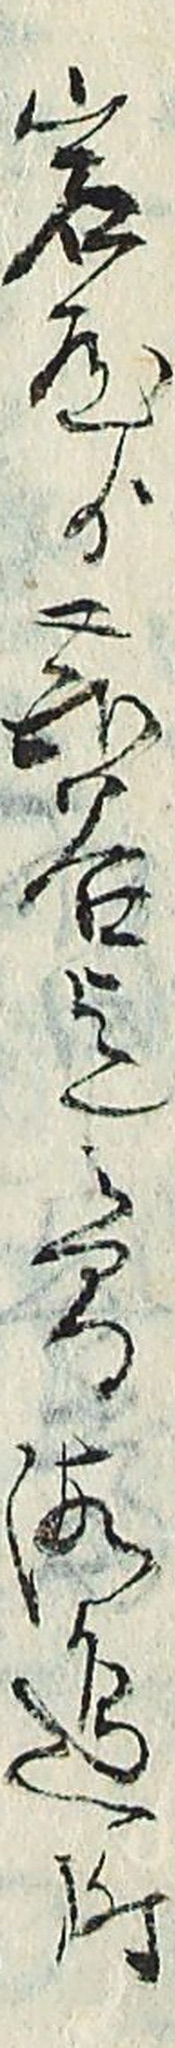岩屋ゟ苅谷迄之間海辺附
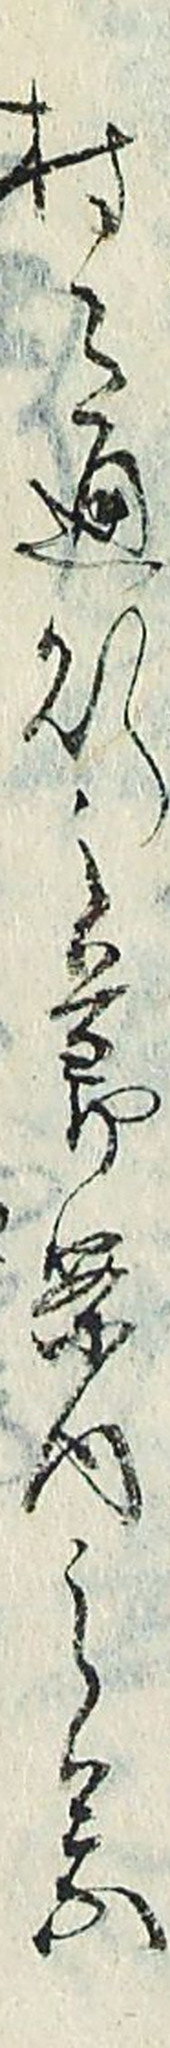村々通行之節案内之義
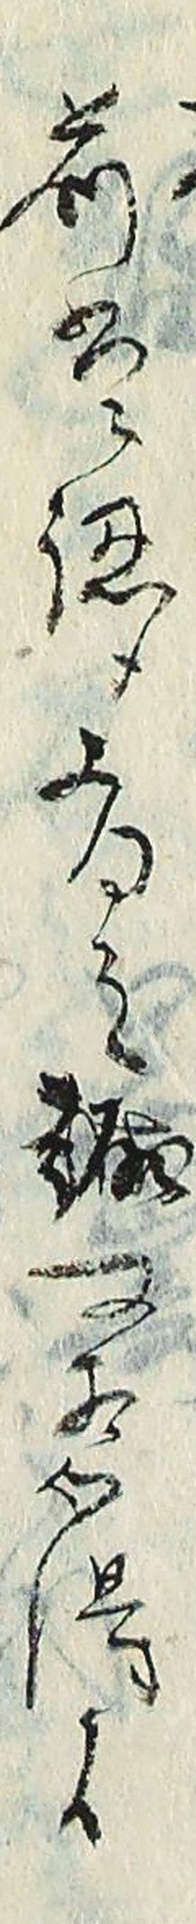前書に認め有之趣可相心得候
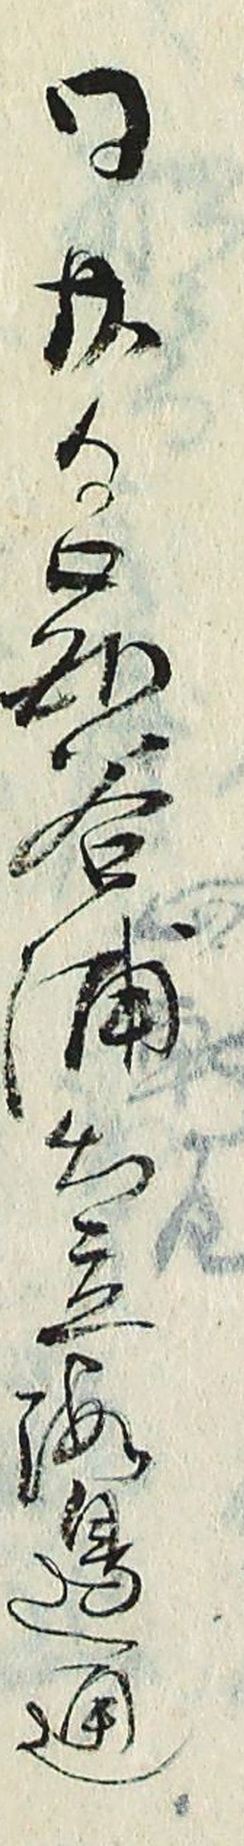同廿日苅谷浦出立海辺通
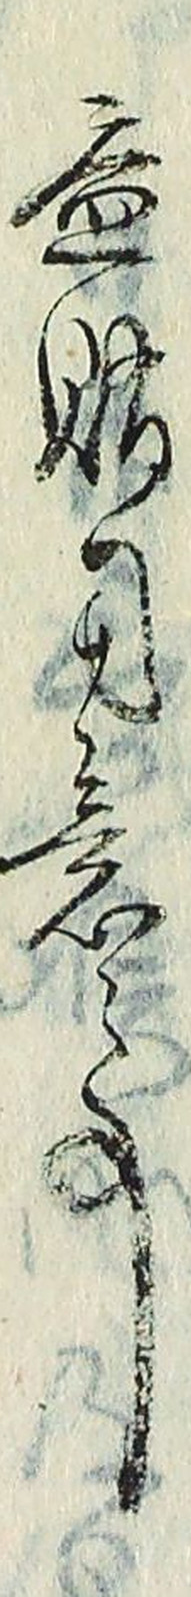昼賄用意之事
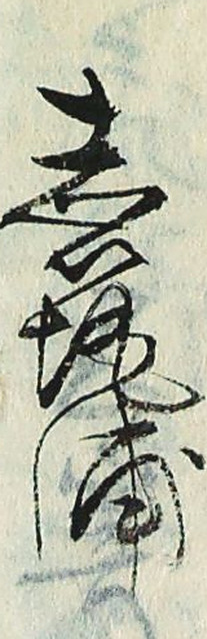志筑浦
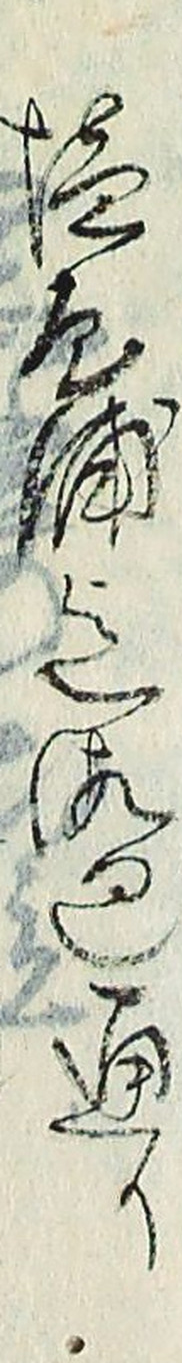塩屋浦迄海辺通り
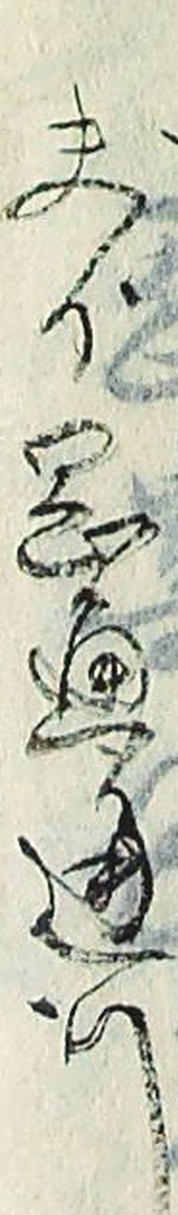夫ゟ岡通通行
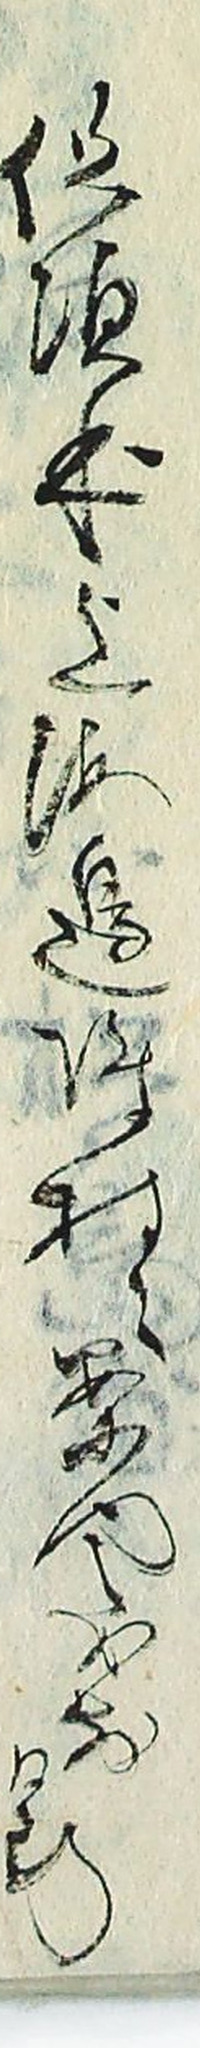但須本迄海辺附村々案内之義前同断
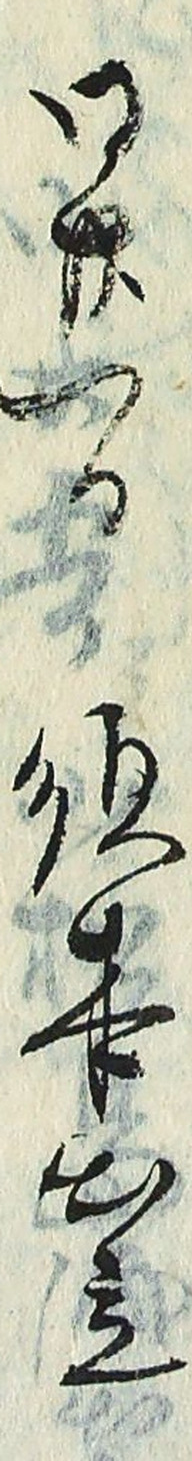同廿一日須本出立
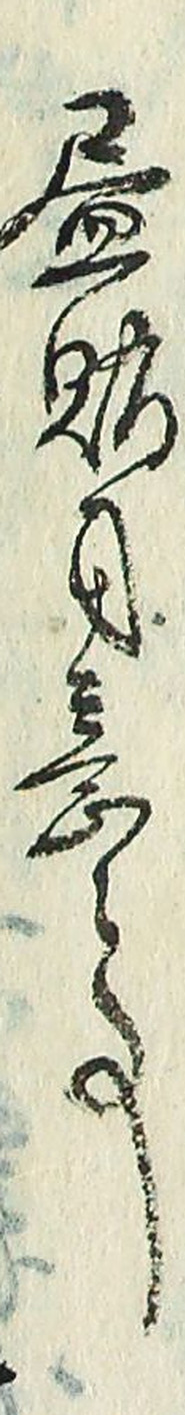昼賄用意之事
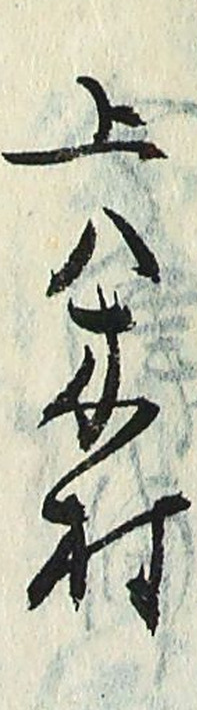上八木村
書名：公辺御役人為御廻浦御立越諸御用一巻
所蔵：鳴門教育大学 Naruto University of Education
